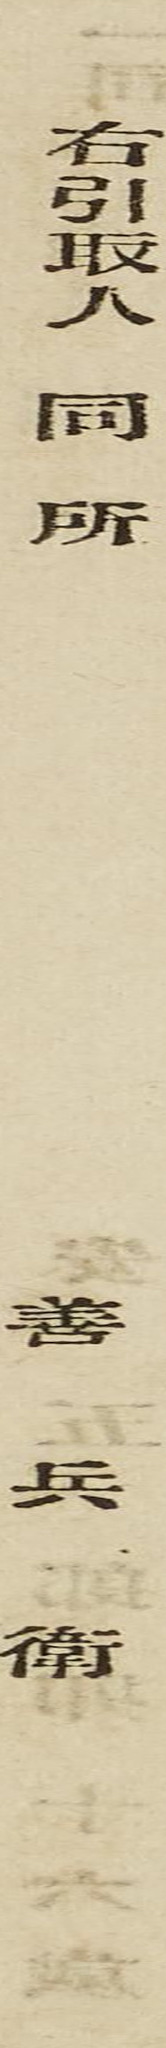右引取人同所善兵衛
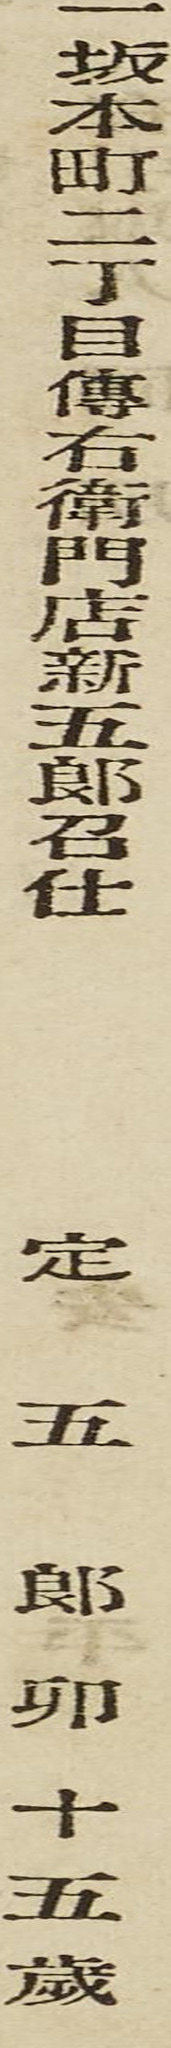一坂本町二丁目傳右衛門店新五郎召仕定五郎卯十五歳
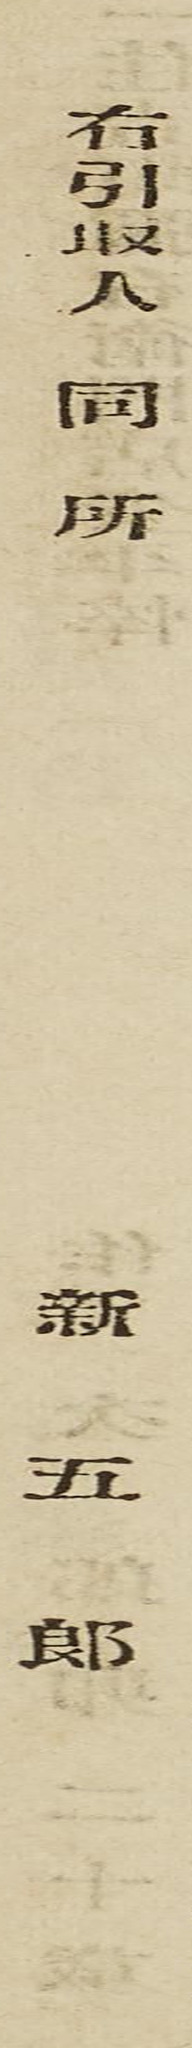右引取人同所新五郎

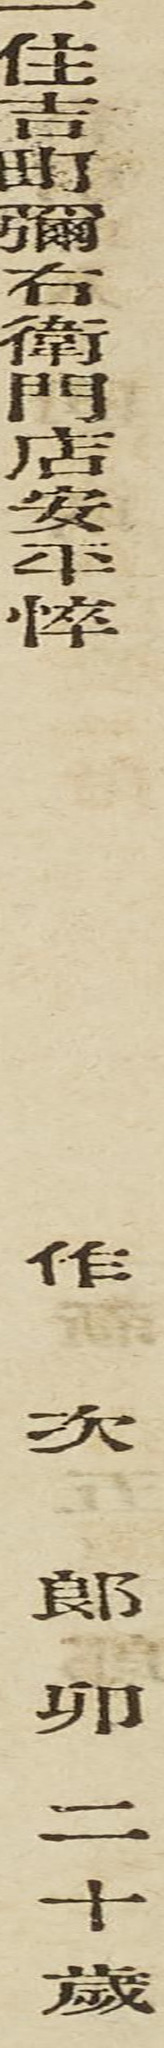一住吉町彌右衛門店安平倅作次郎卯二十歳
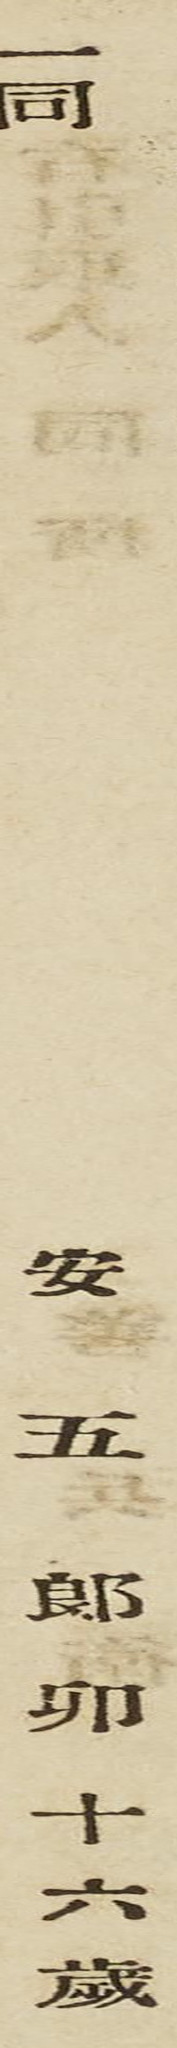一同安五郎卯十六歳
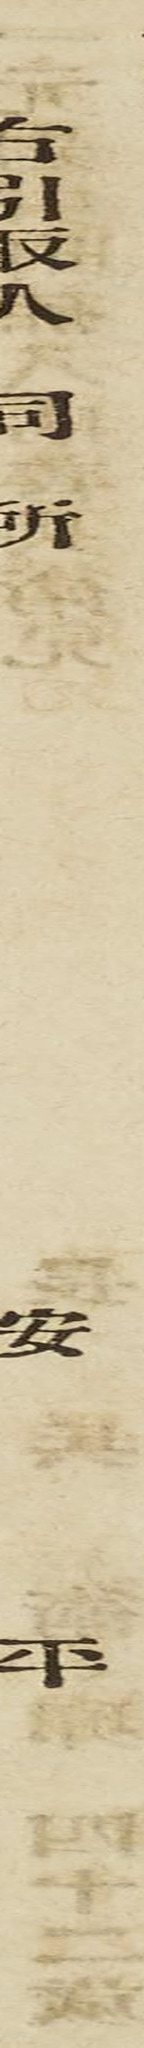右引取人同所安平
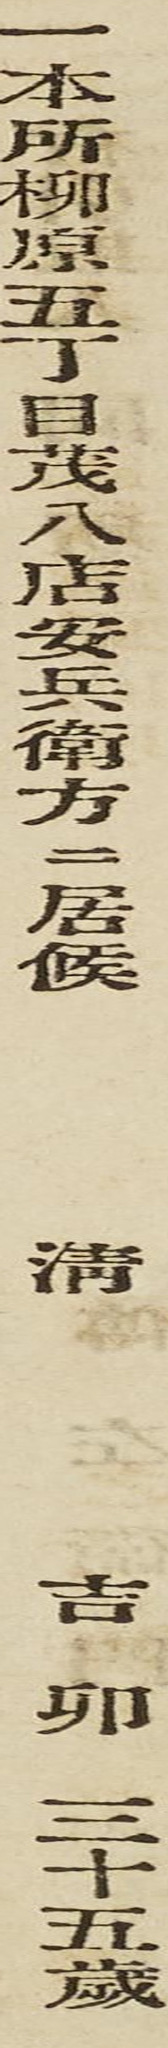一本所柳原五丁目茂八店安兵衛方ニ居候清吉卯三十五歳
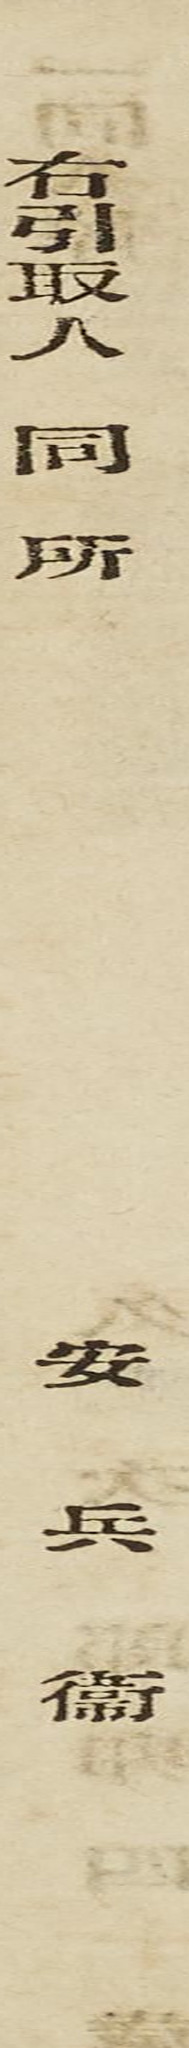右引取人同所安兵衛
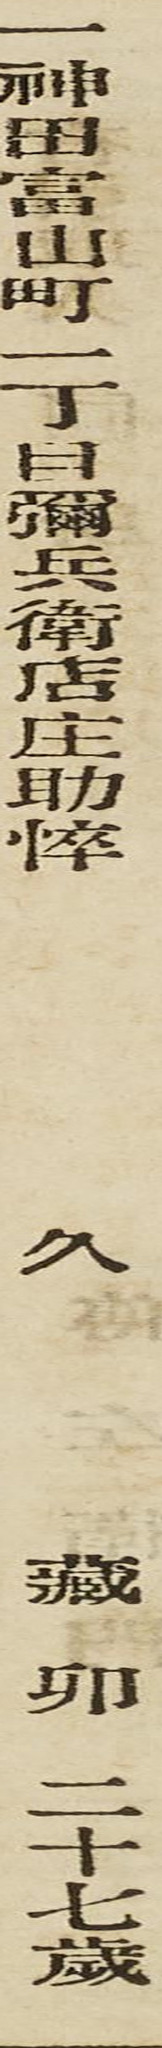一神田富山町一丁目彌兵衛店庄助倅久蔵卯二十七歳
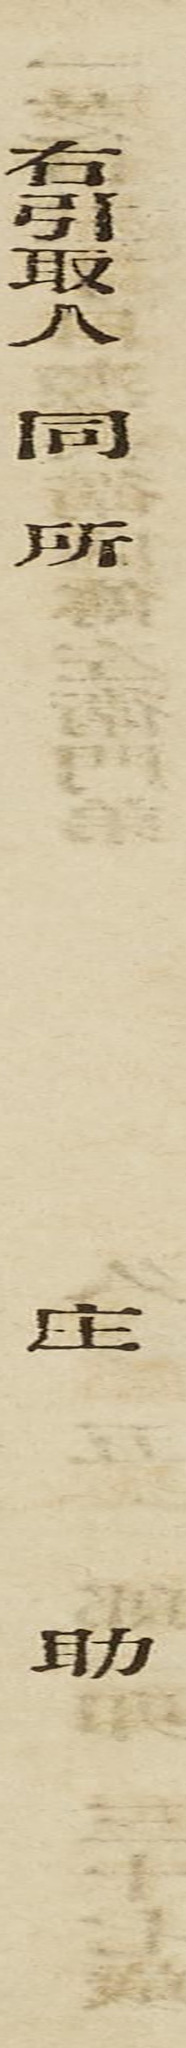右引取人同所庄助
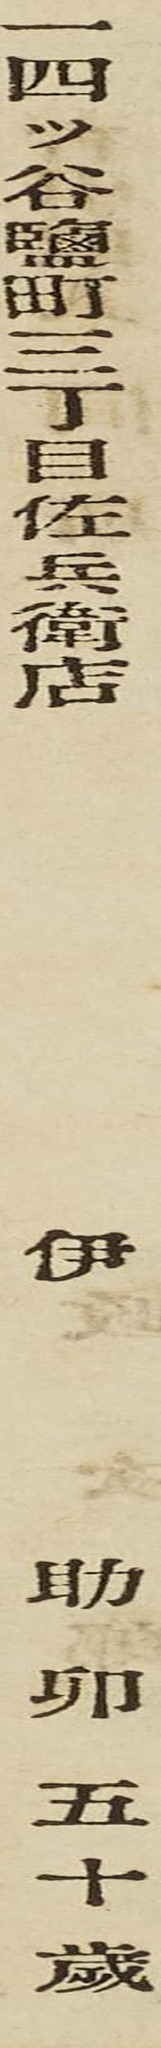一四ツ谷鹽町三丁目佐兵衛店伊助卯五十歳
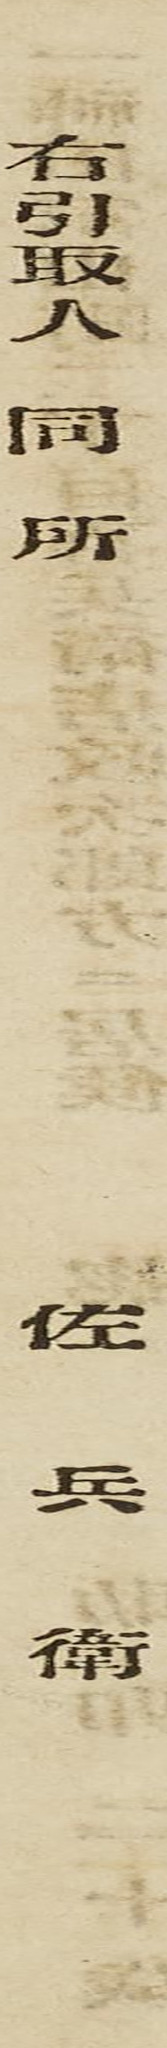右引取人同所佐兵衛
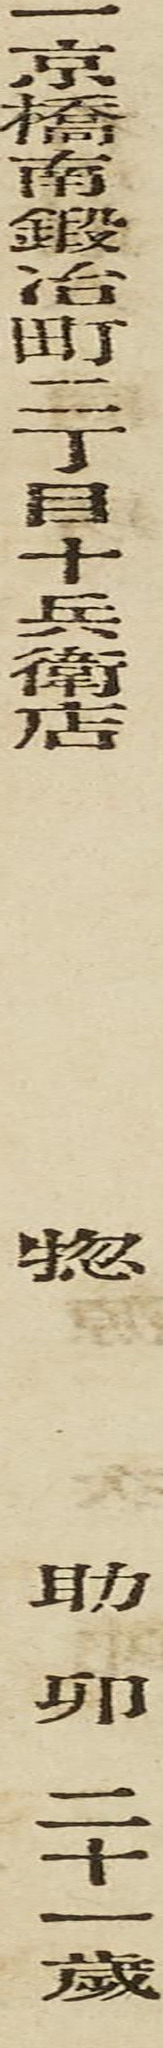一京橋南鍛冶町二丁目十兵衛店惣助卯二十一歳
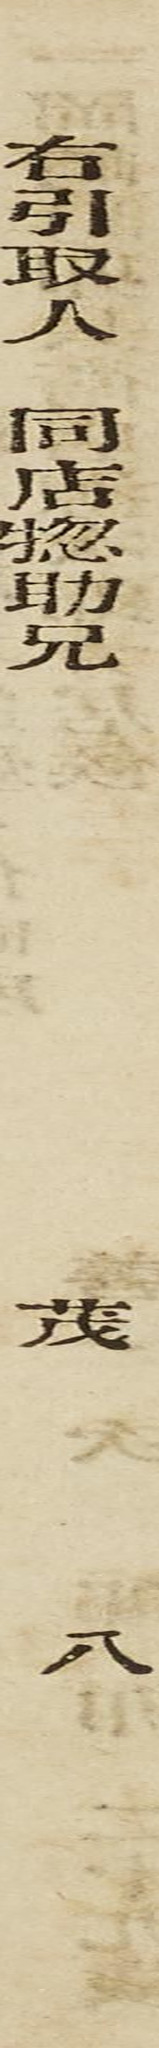右引取人同店惣助兄茂八
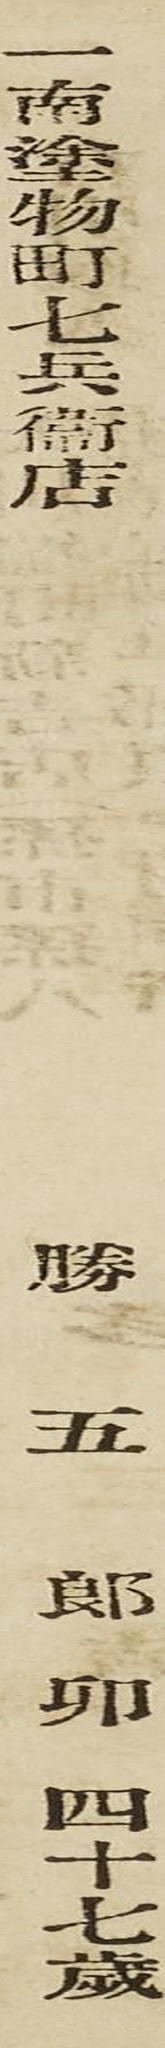一南塗物町七兵衛店勝五郎卯四十七歳
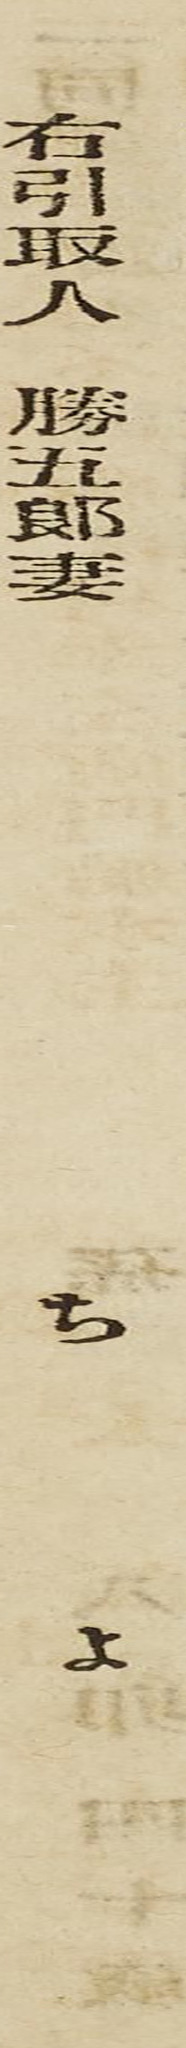右引取人勝五郎妻ちよ
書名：永代惨話　文化の夢　全
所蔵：東京大学地震研究所図書室 Earthquake Research Institute Library, The University of Tokyo, JAPAN
